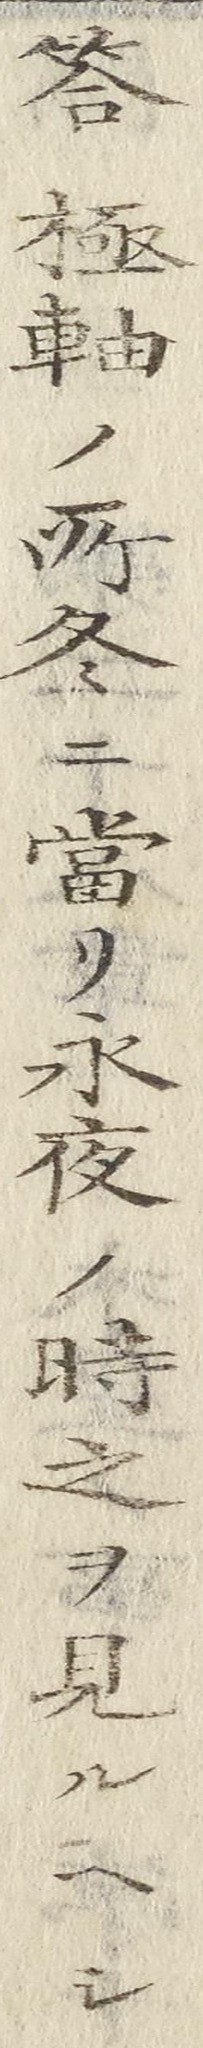答極軸ノ所冬二当リ永夜ノ時之ヲ見ルヘシ
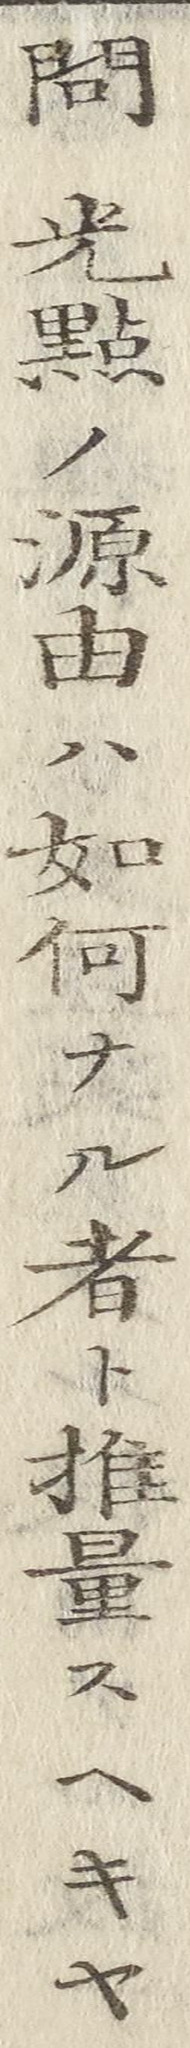問光点ノ源由ハ如何ナル者ト推量スヘキヤ
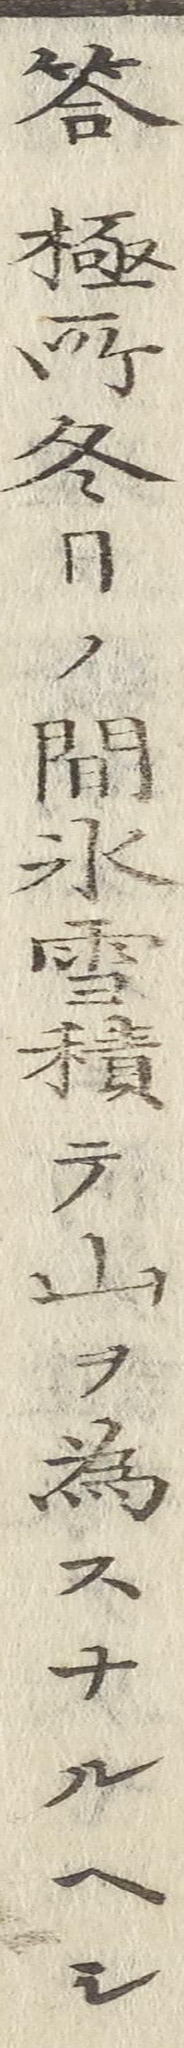答極所冬月ノ間氷雪積テ山ヲ為スナルヘシ
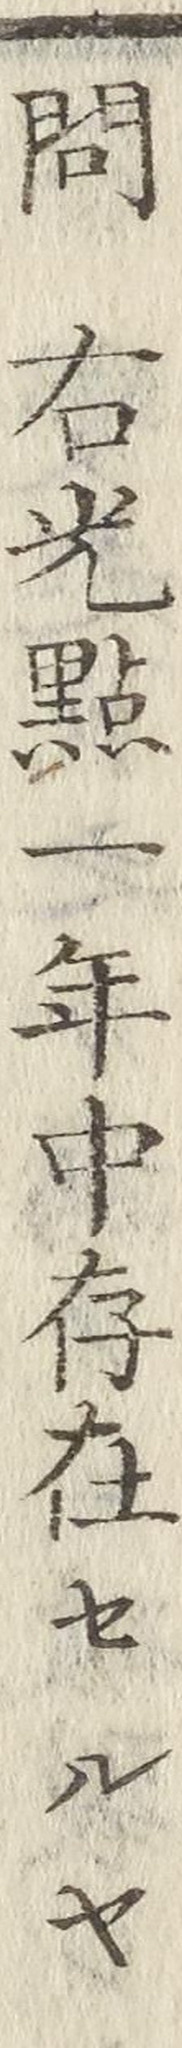問右光点一年中存在セルヤ
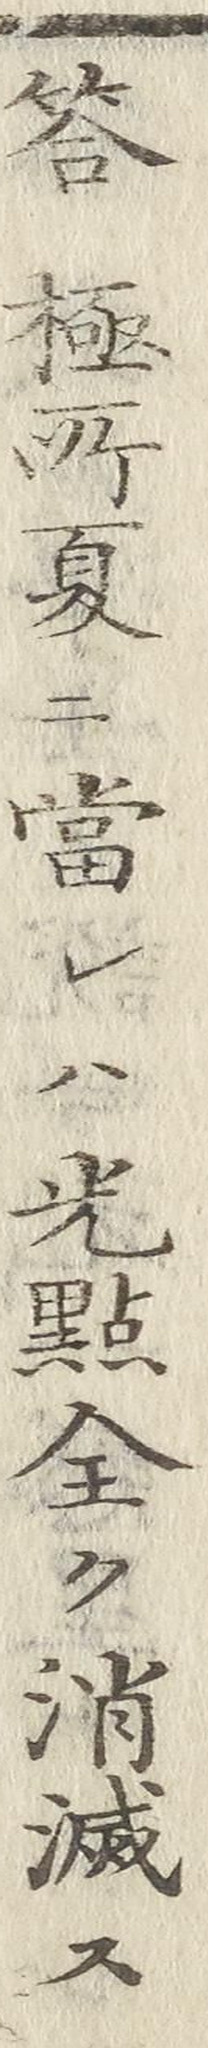答極所夏ニ当レハ光点全ク消滅ス
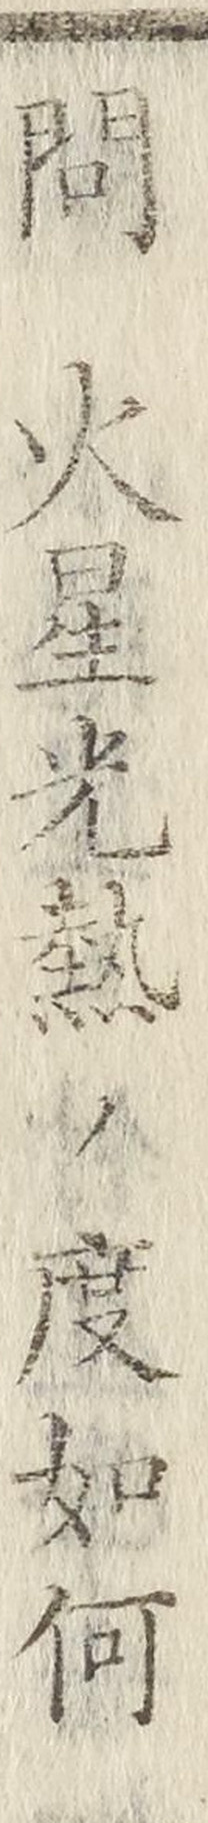問火星光熱ノ度如何
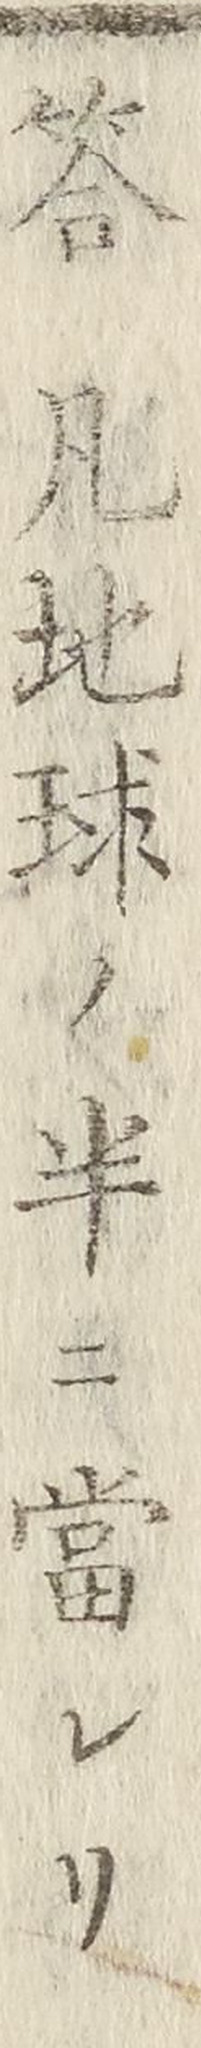答凡地球ノ半二当レリ
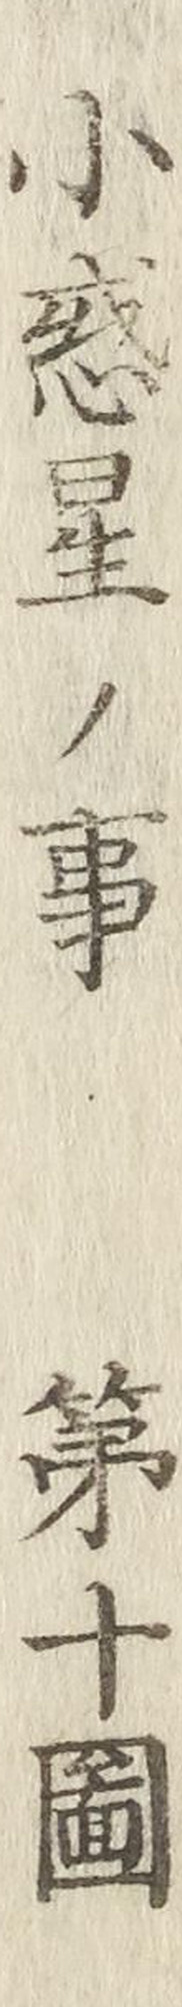小惑星ノ事第十図
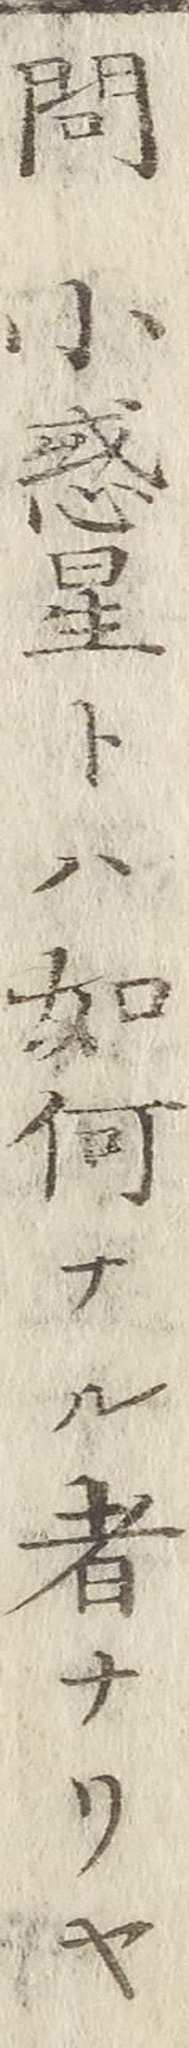問小惑星トハ如何ナル者ナリヤ
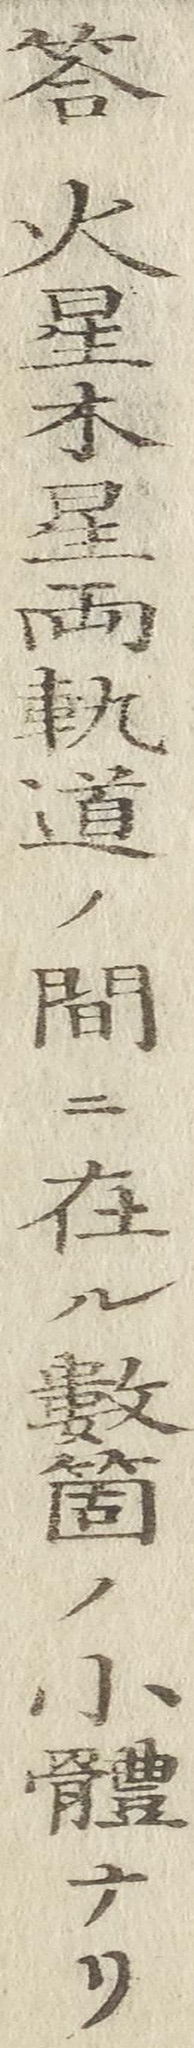答火星木星両軌道ノ間ニ在ル数個ノ小体ナリ

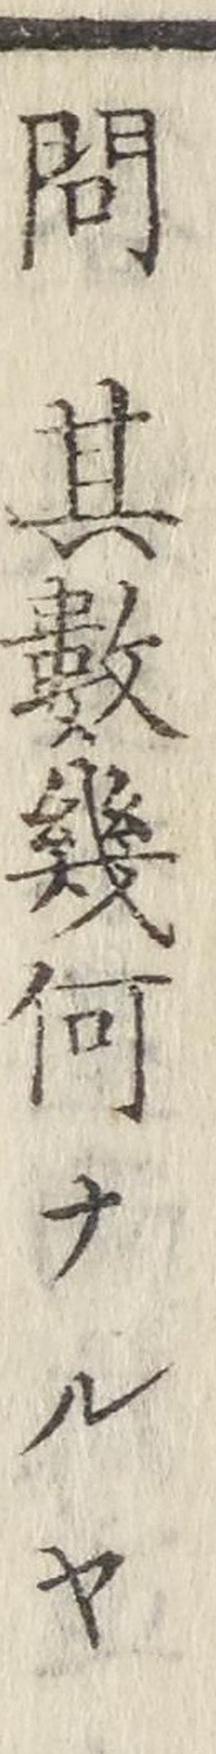問其数幾何ナルヤ
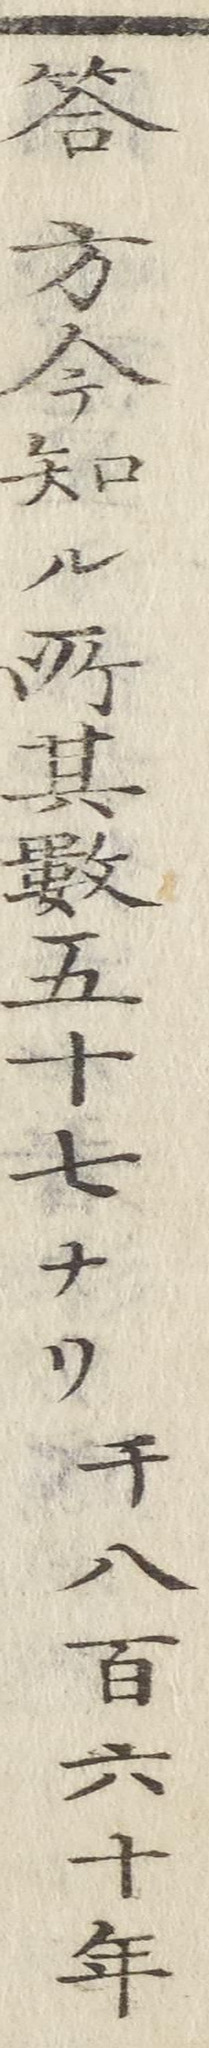答方今知ル所其数五十七ナリ千八百六十年
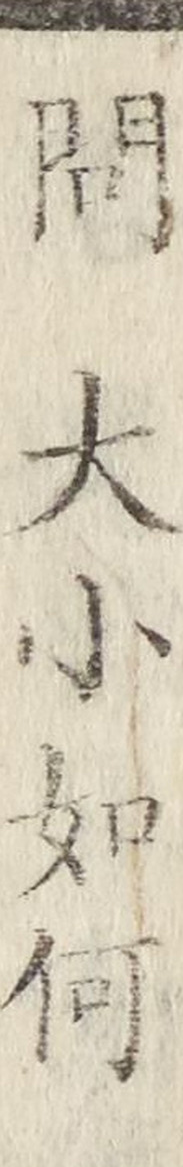問大小如何
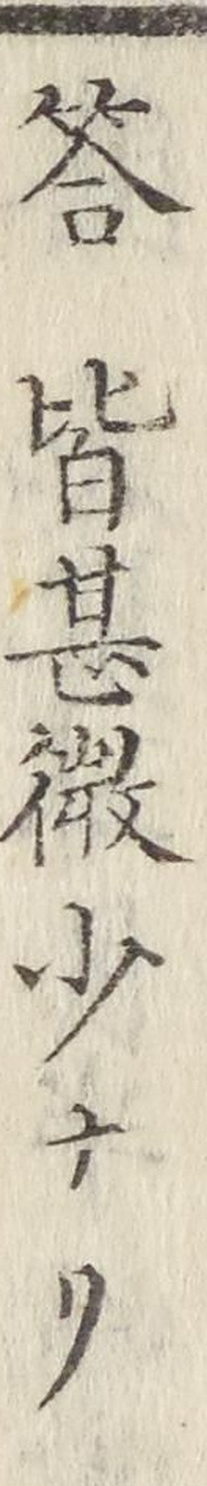答皆甚微少ナリ
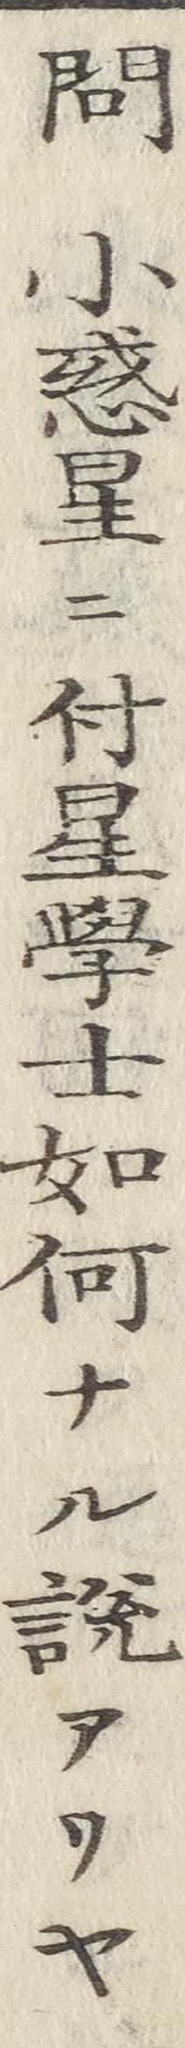問小惑星ニ付星学士如何ナル説アリヤ
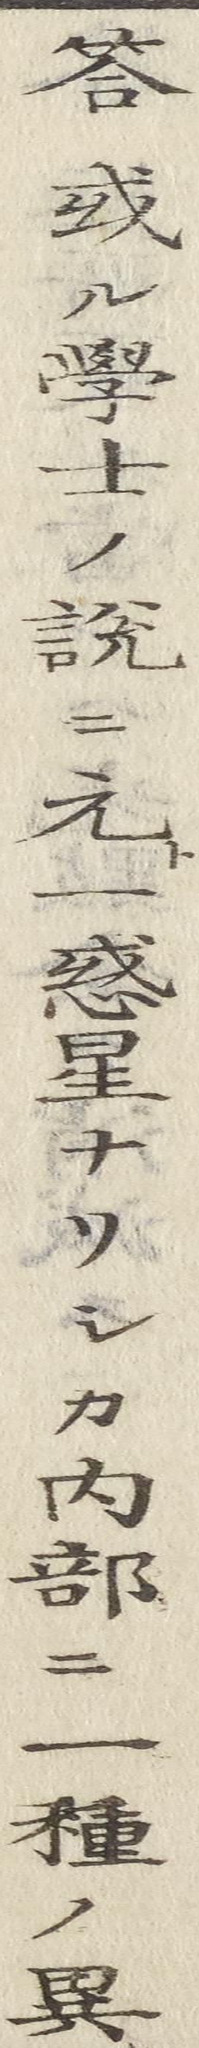答或ル学士ノ説ニ元ト一惑星ナリシカ内部ニ一種ノ異
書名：星学圖説　上
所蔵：東京大学地震研究所図書室 Earthquake Research Institute Library, The University of Tokyo, JAPAN
